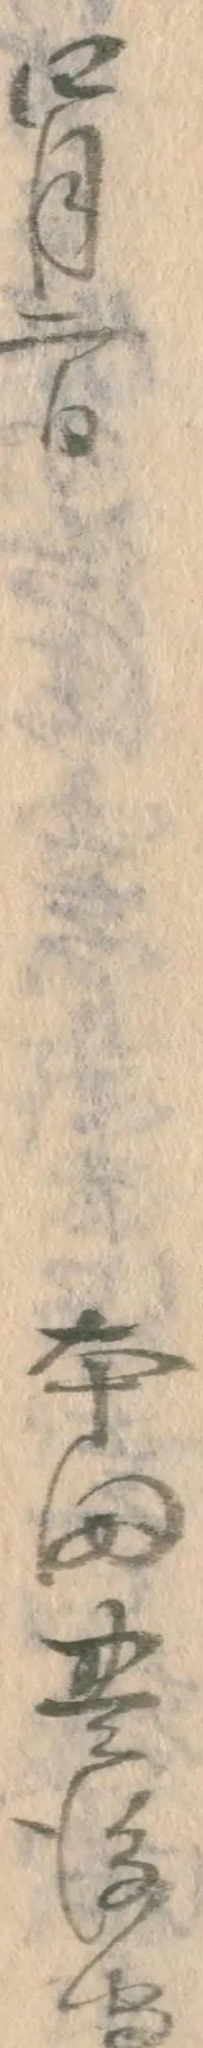四月二日本田豊後守
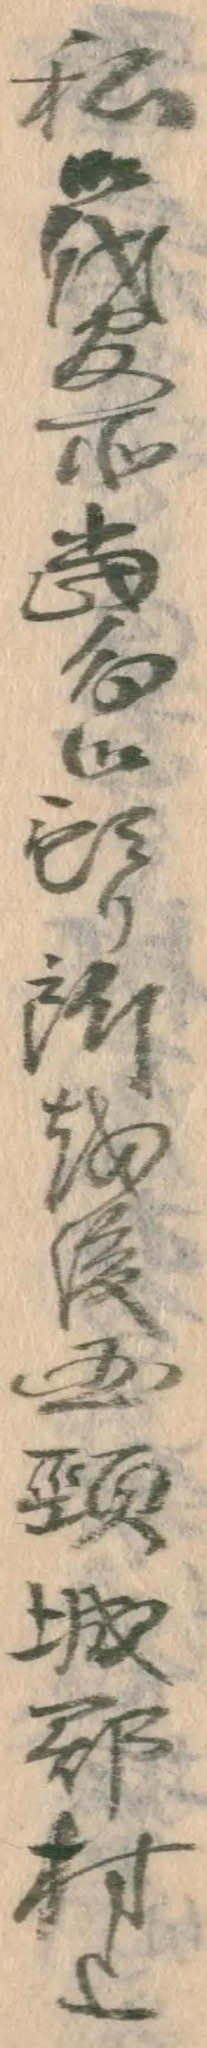私御代官所当分御預り所越後国頸城郡村上
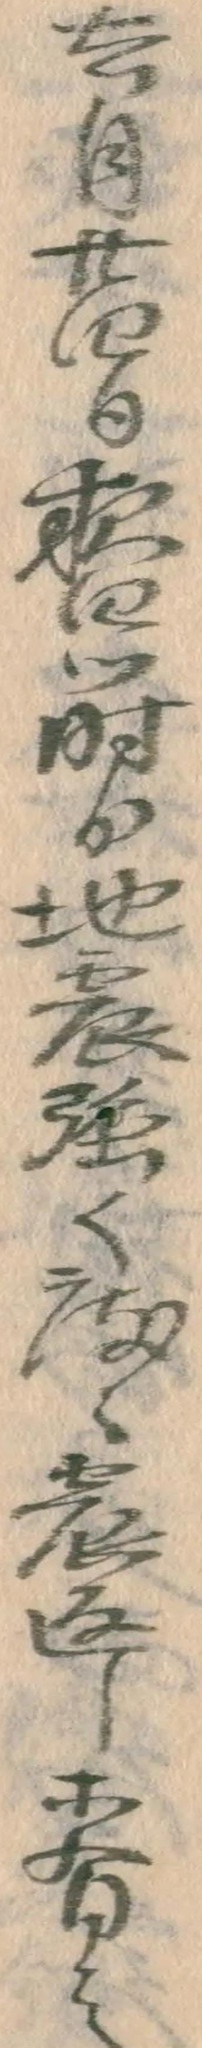去月廿四日夜四ッ時ゟ地震強く度々震返し等有之
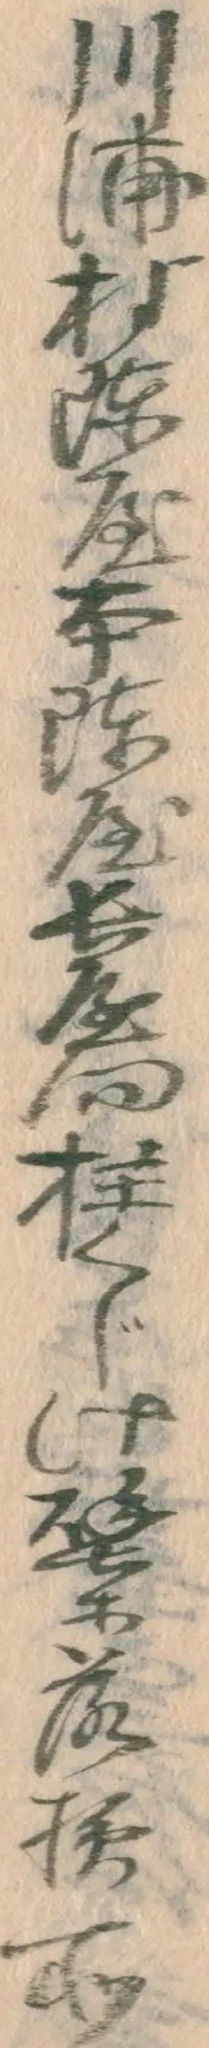川浦村陣屋本陣屋長屋向柱くじけ壁等落損所
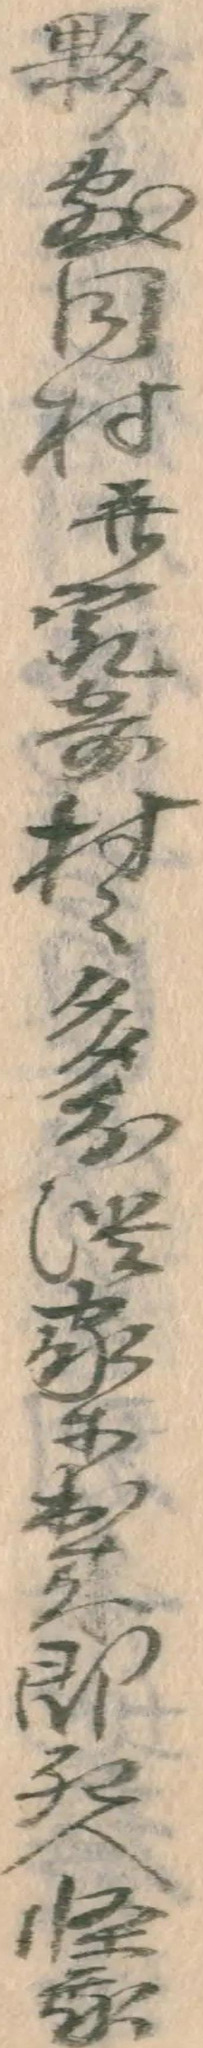夥敷同村并最寄村々多分潰家等出其上即死人怪我
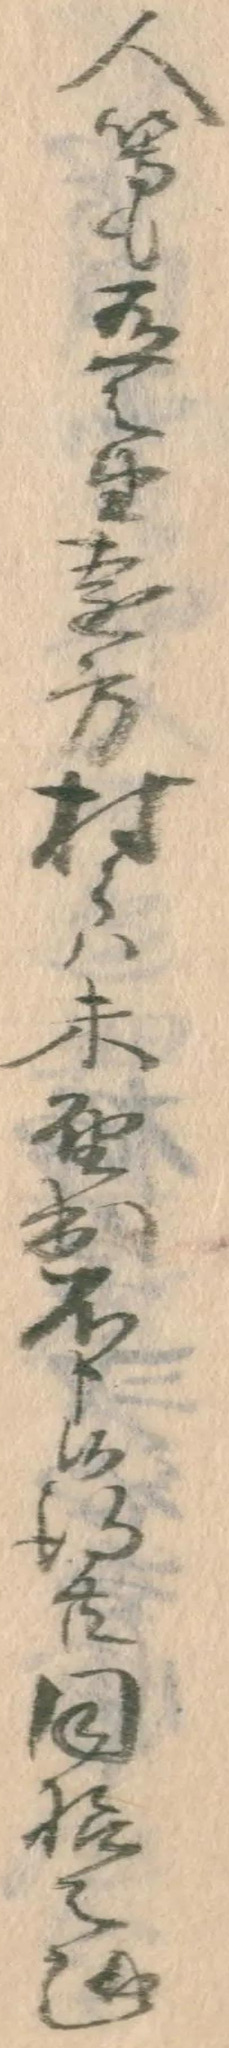人等も有之由遠方村々ハ未届出不申候得共同様之趣
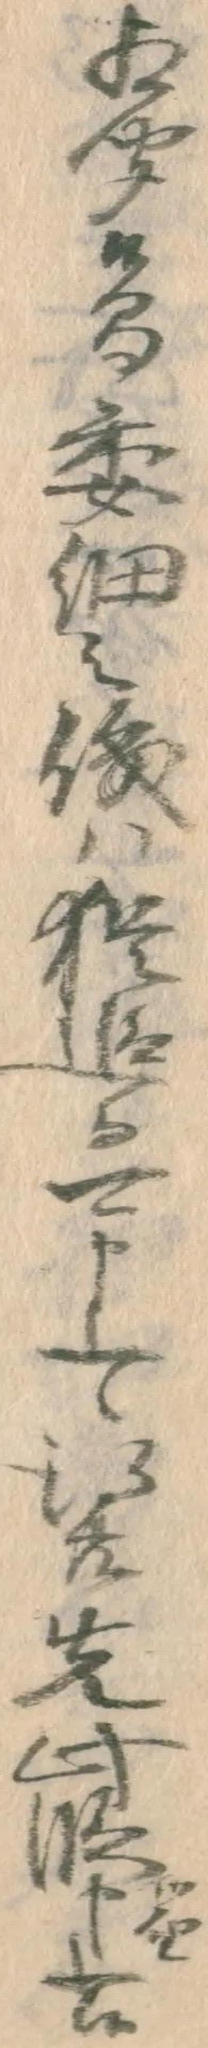相聞候間委細之儀ハ猶追而可申候得共先此段御届申上候
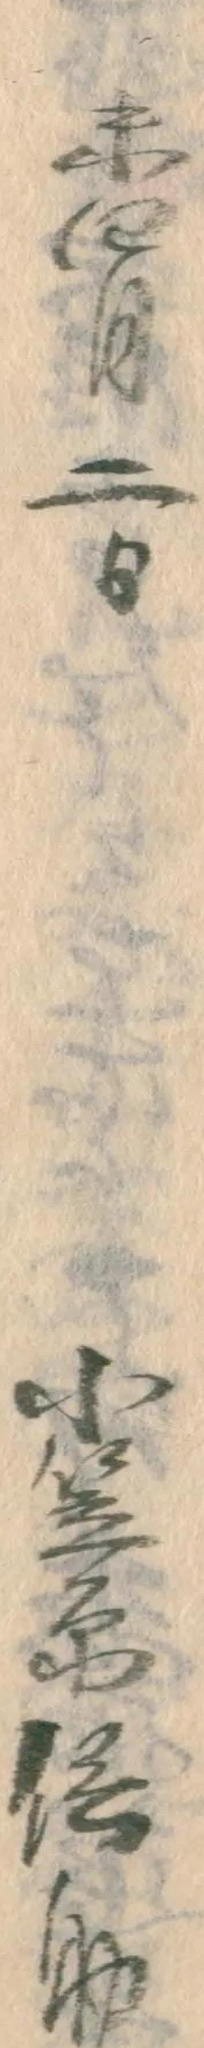未四月二日小笠原信助
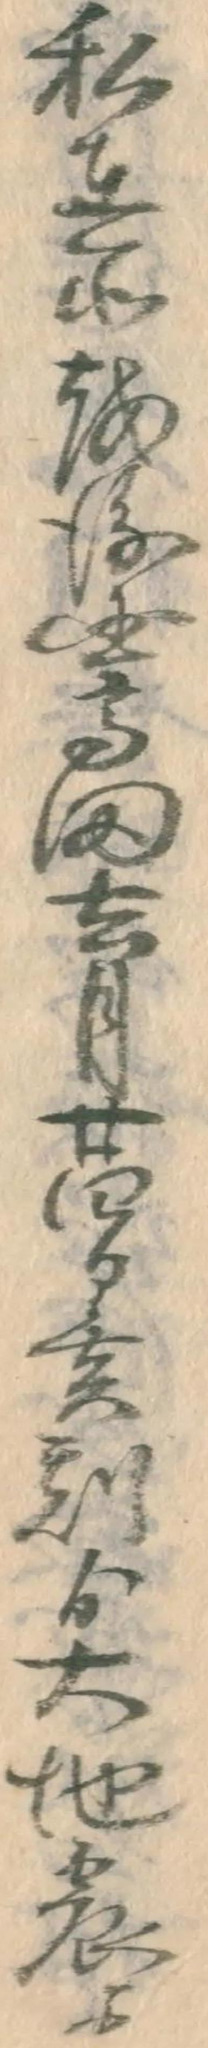私在所越後国高田去月廿四日亥刻ゟ大地震二而

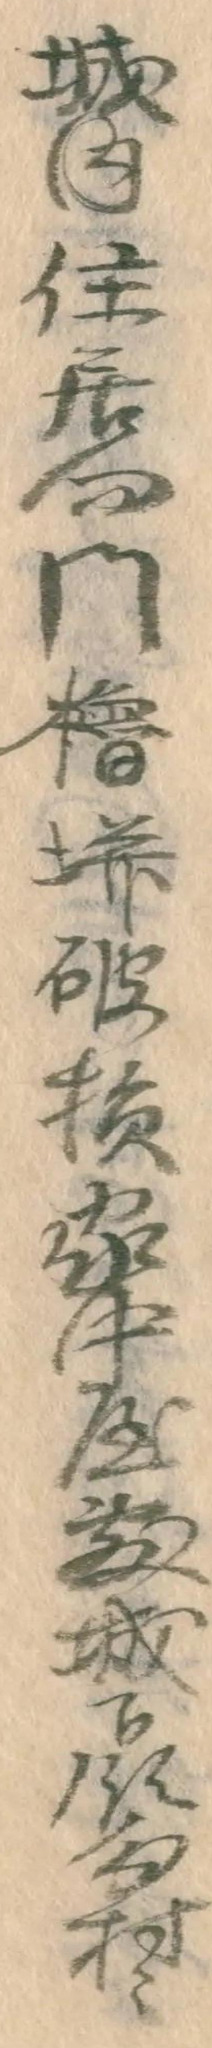城内住居向門櫓塀破損家中屋敷城下領分村々
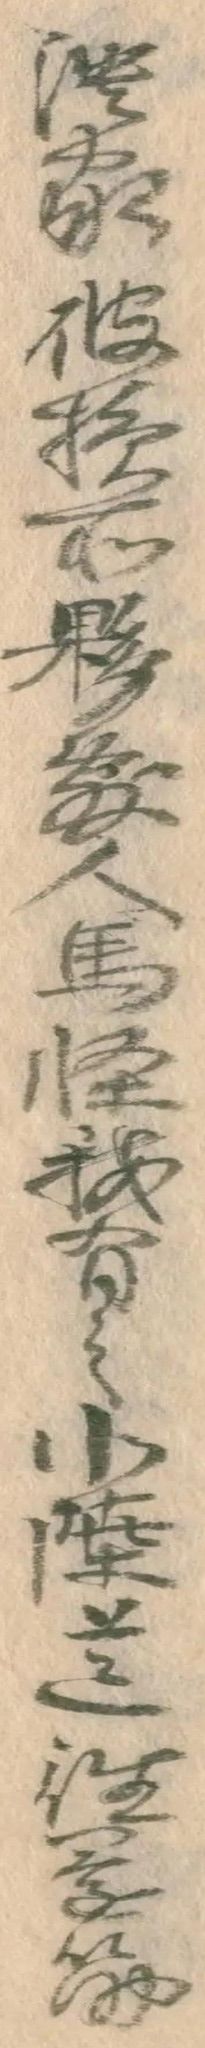潰家破損所夥敷人馬怪我有之北陸道往還筋
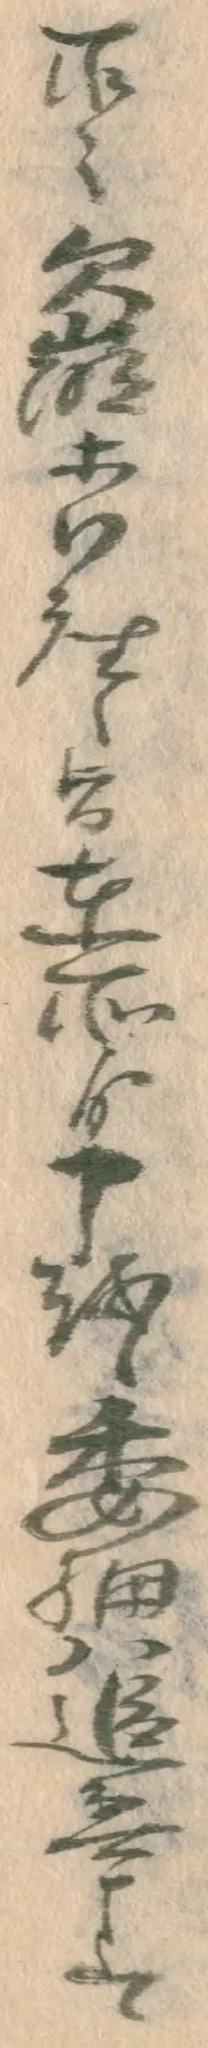所々欠崩等御座候旨在所ゟ申越候委細ハ追而可申上候
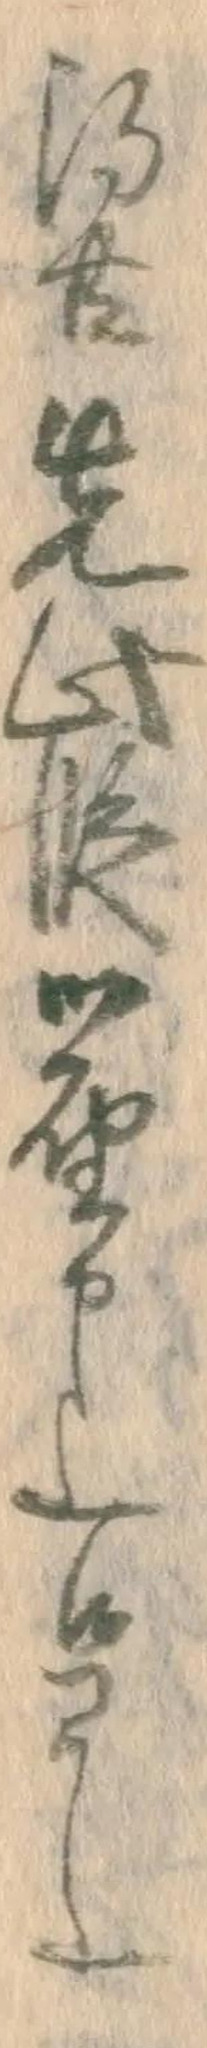得共先此段御届申上候已上
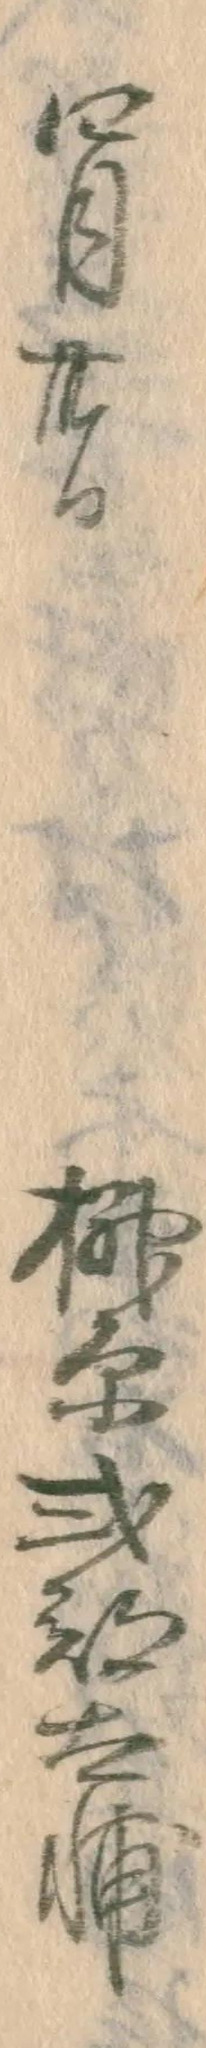四月廿日榊原式部大輔
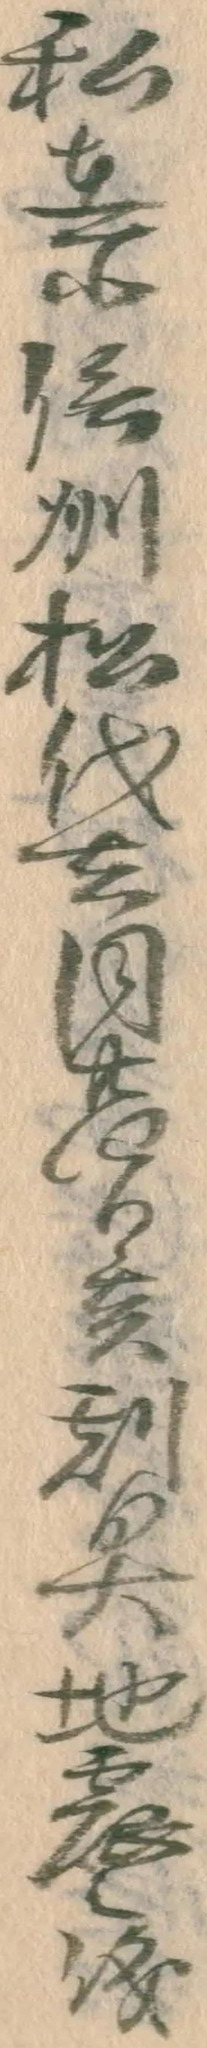私在所信州松代去月廿四日亥刻ゟ大地震之儀
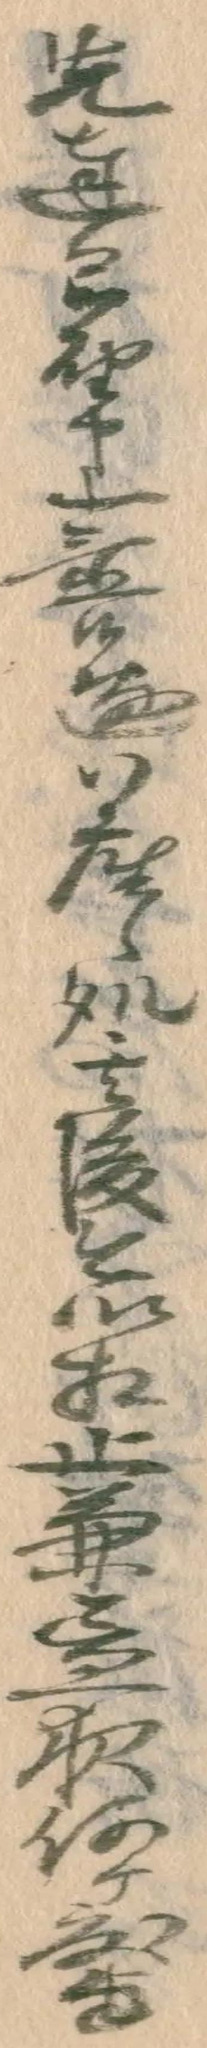先達而御届申上置候通ニ御座候処其後今以相止兼昼夜何ケ度と
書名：信州大地震之記
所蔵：国立国会図書館 National Diet Library, JAPAN
